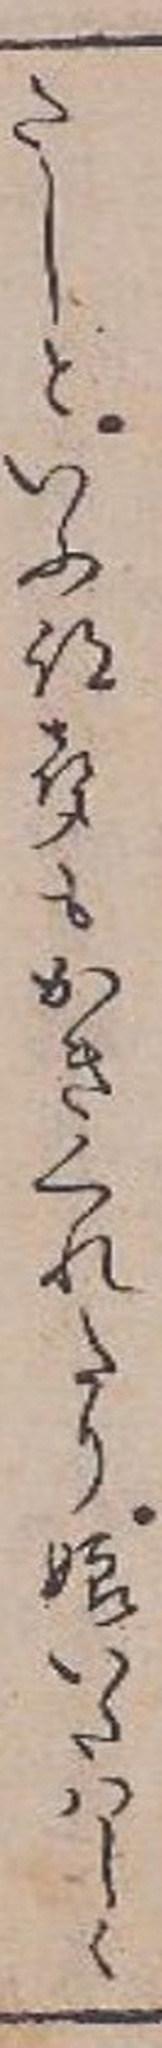たしと、いふ泣声もかきくれたり、娘いたはしく
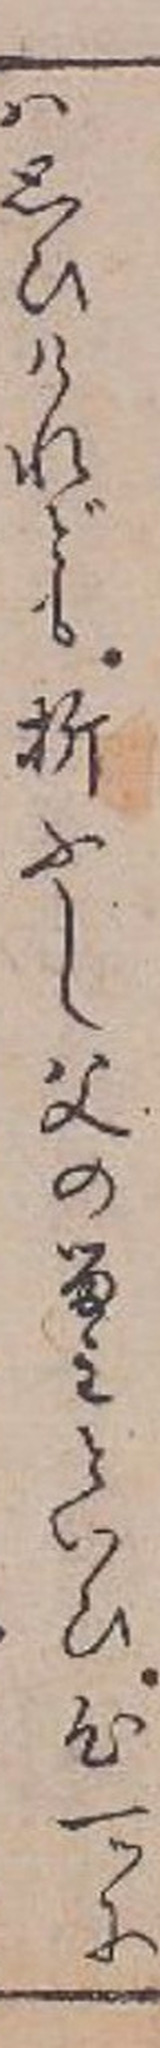は思ひけれども、折ふし父の留主といひ、心一つに
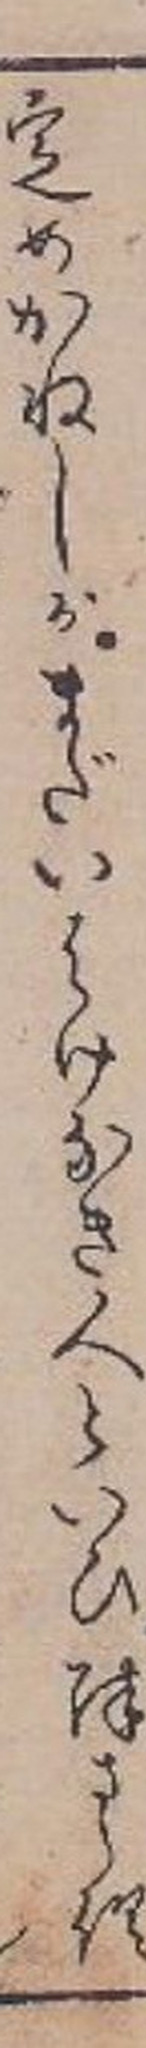定めかねしか、まだいはけなき人といひ、殊さら俱
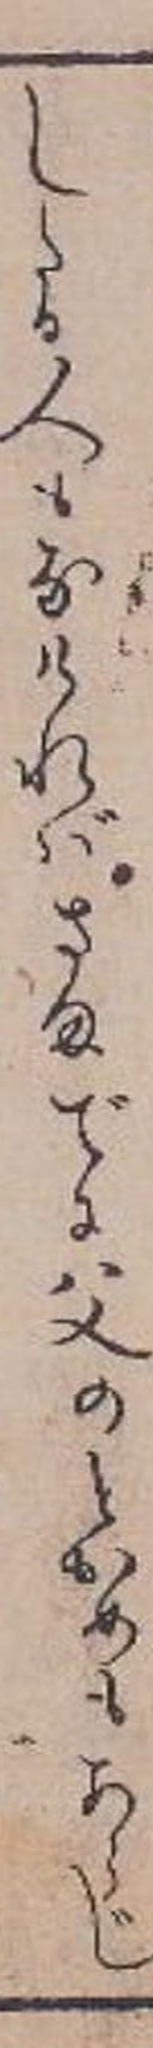したる人もなければ、さまでに父のとかめもあらじ
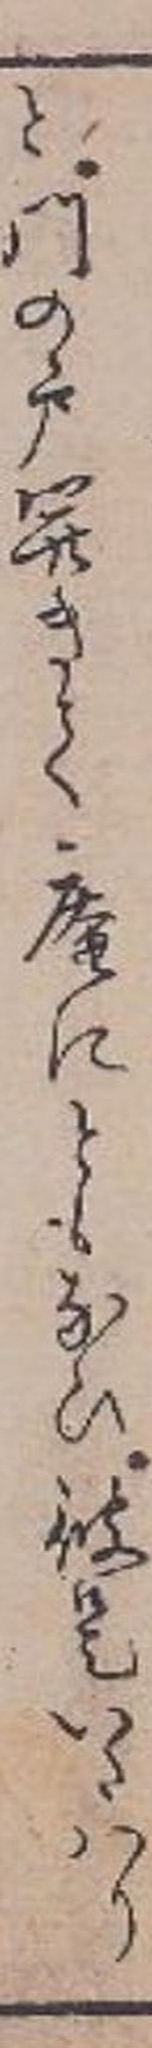と、門の戸開きて庵にともなひ、彼是いたはり
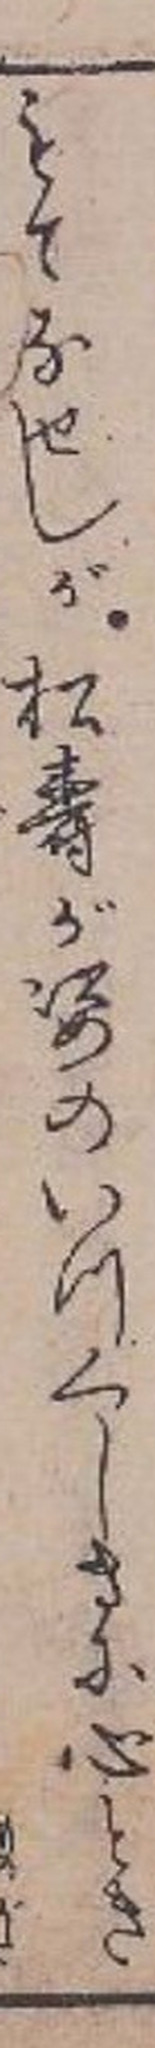もてなせしが、松寿が姿のいつくしきに心とき
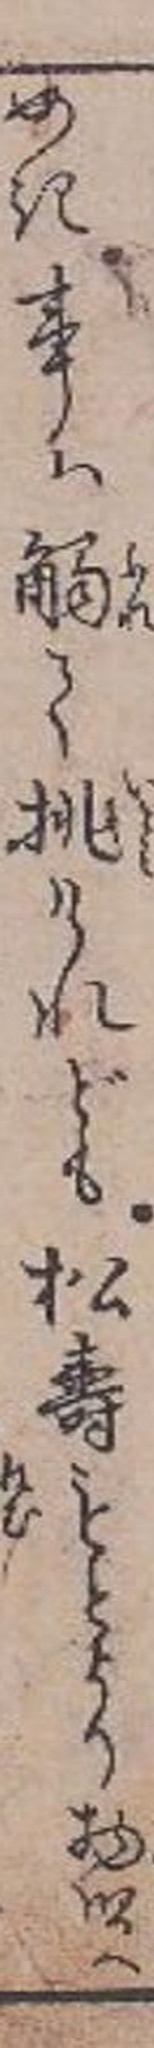めき、事に触て挑けれども、松寿もとより物堅
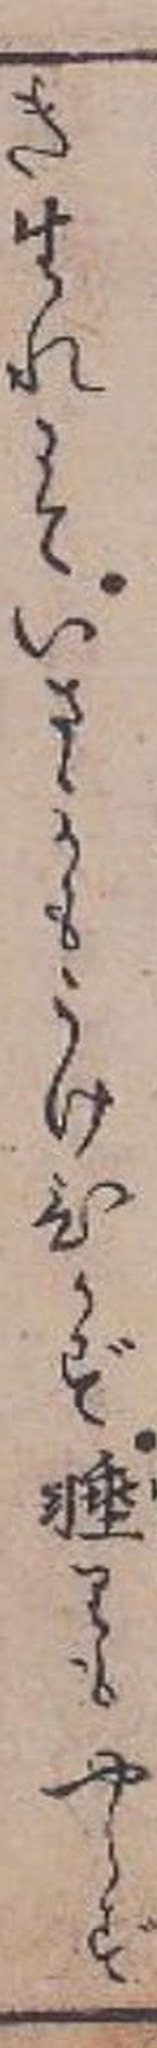き生れにて、いさゝかもうけひうけひかず、睡りもやらず
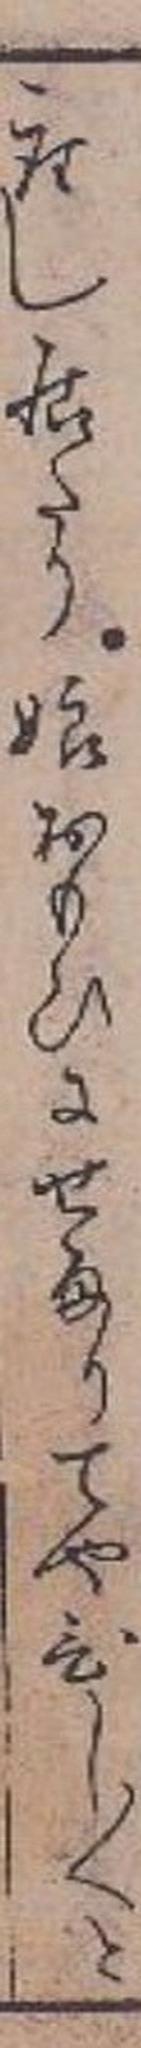座し居たり、娘おもひにせまりてやひし〳〵と

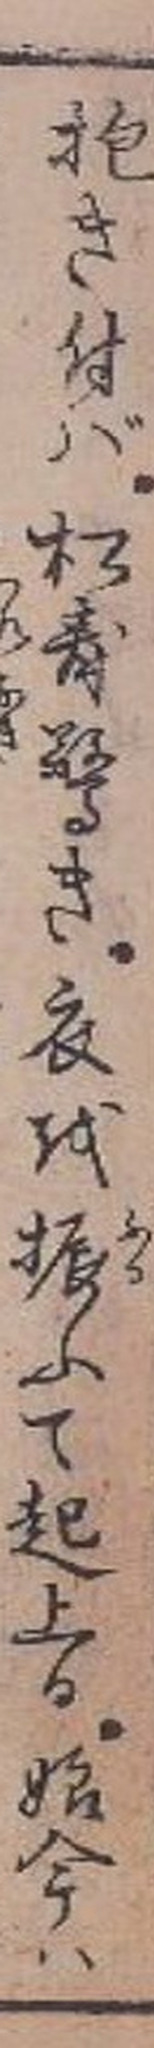抱き付ば、松寿驚き、衣を振ふて起上る、娘今は
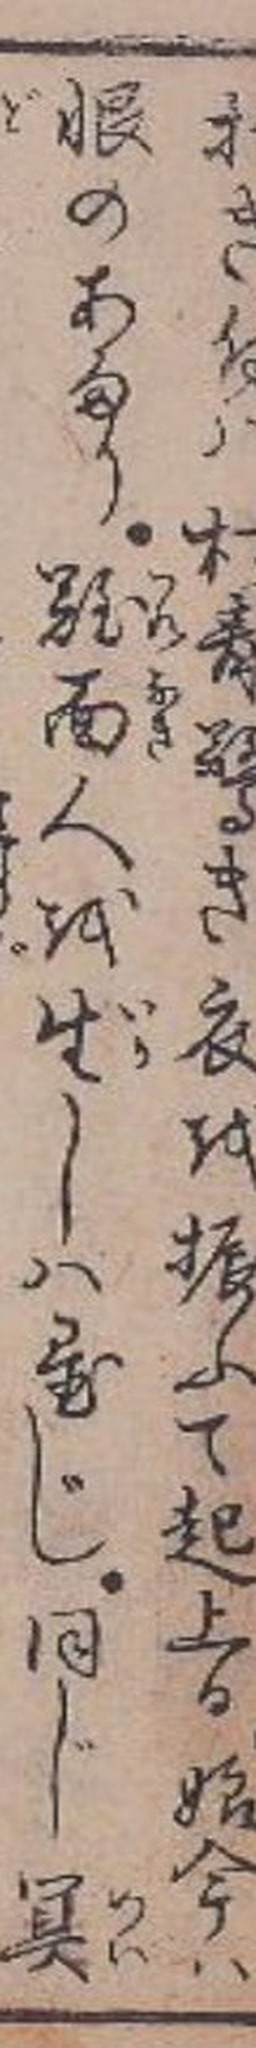恨のあまり、難面人を生しは置じ、同じ冥
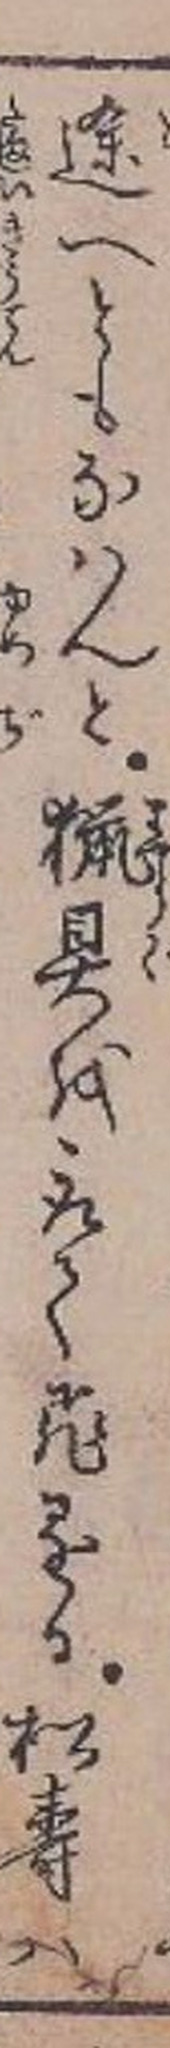途へともなはんと、猟具を取て飛懸る、松寿は
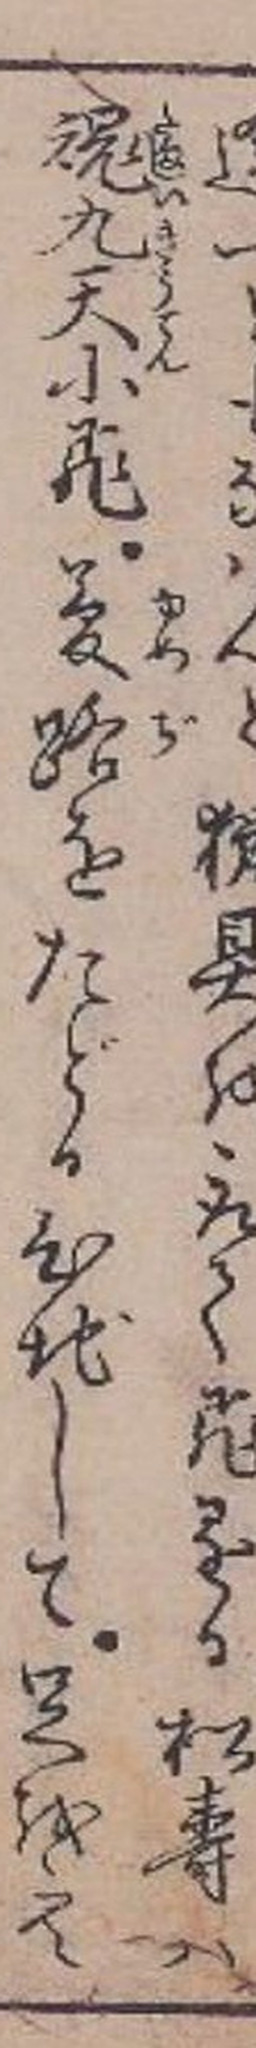魂九天に飛、夢路をたどる心地して、足を空
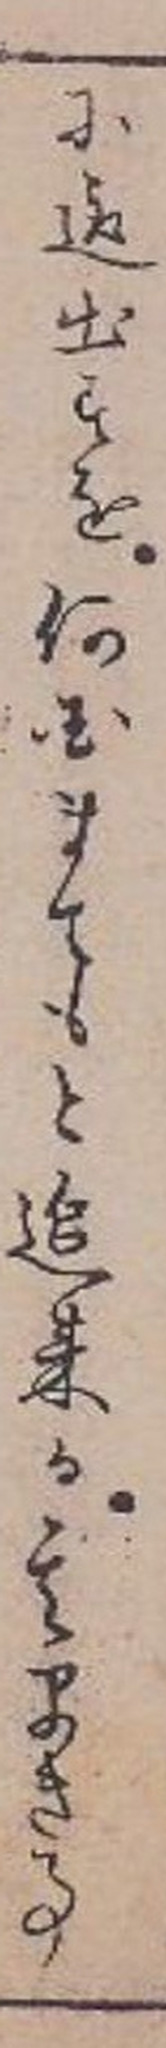に逃出すを、何国まてもと追来る、其早き事
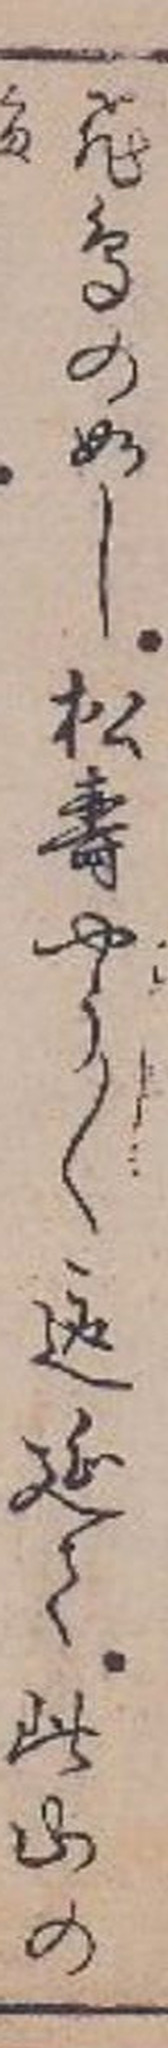飛鳥の如し、松寿やう〳〵逃延て、此山の
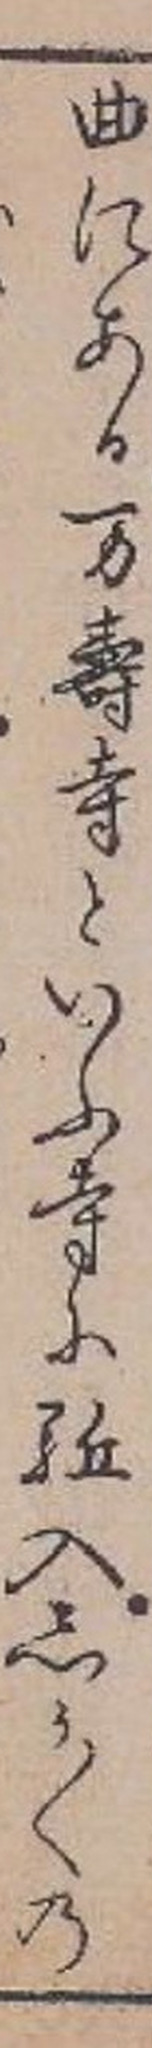曲にある、万寿寺といふ寺に駈入、しか〳〵の
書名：琉球談
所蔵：University of the Ryukyus Library
